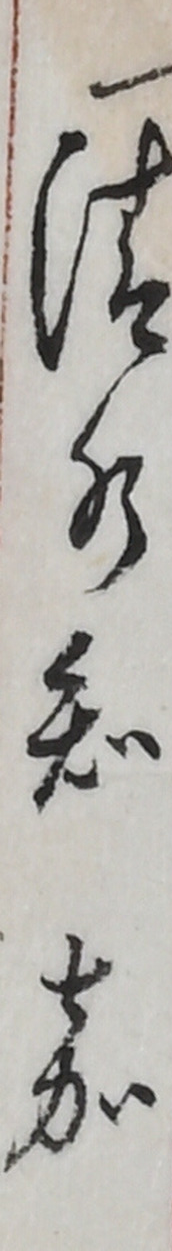清水知嘉
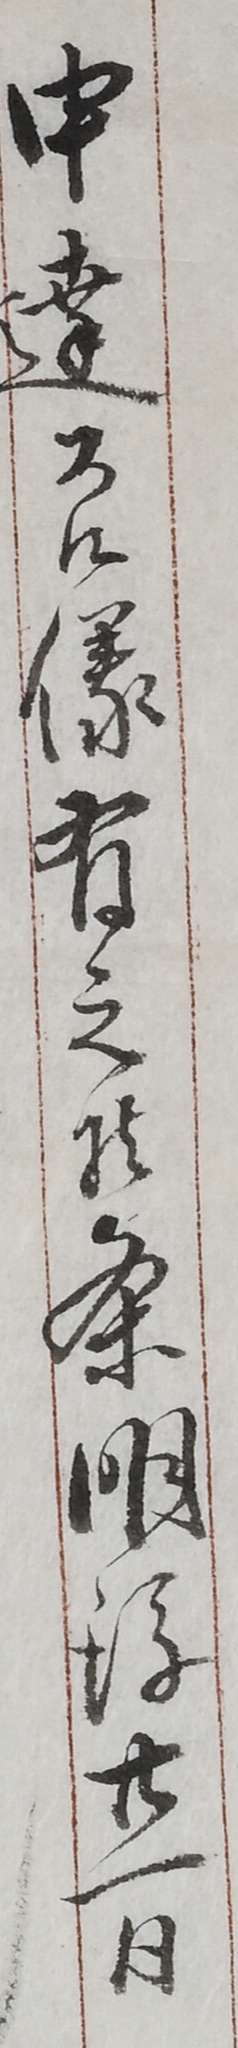申達スル儀有之候条明後廿一日
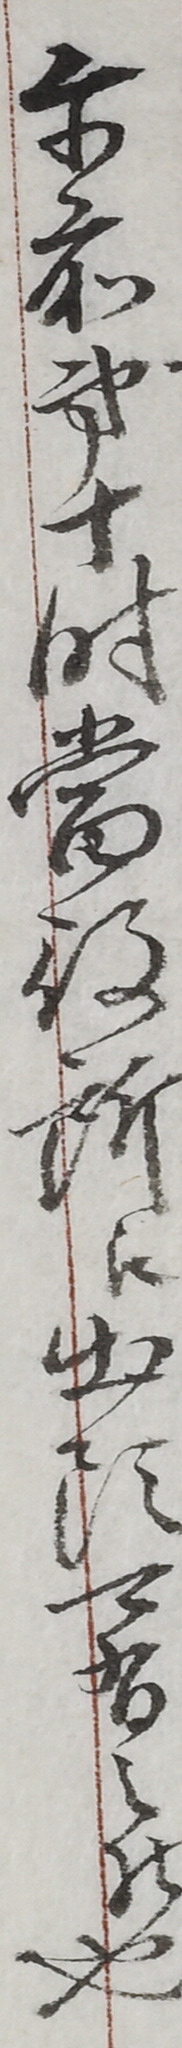午前第十時当役所江出頭可有之候也
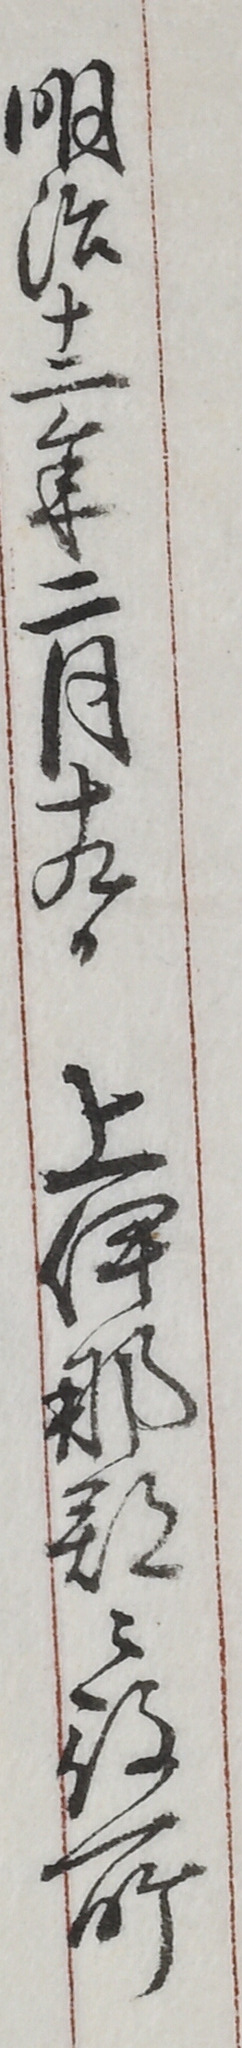明治十二年二月十九日上伊那郡々役所
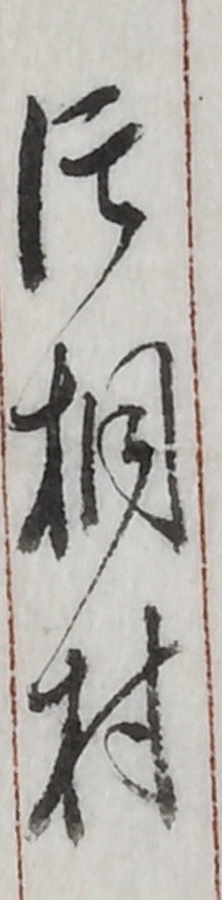片桐村
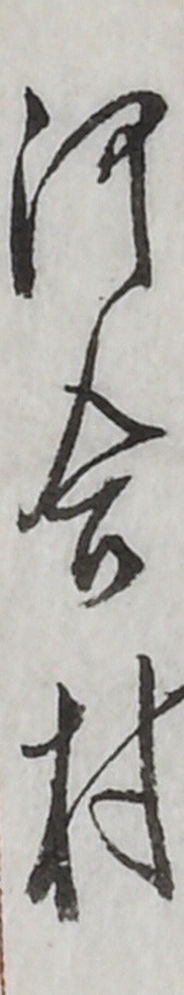河合村

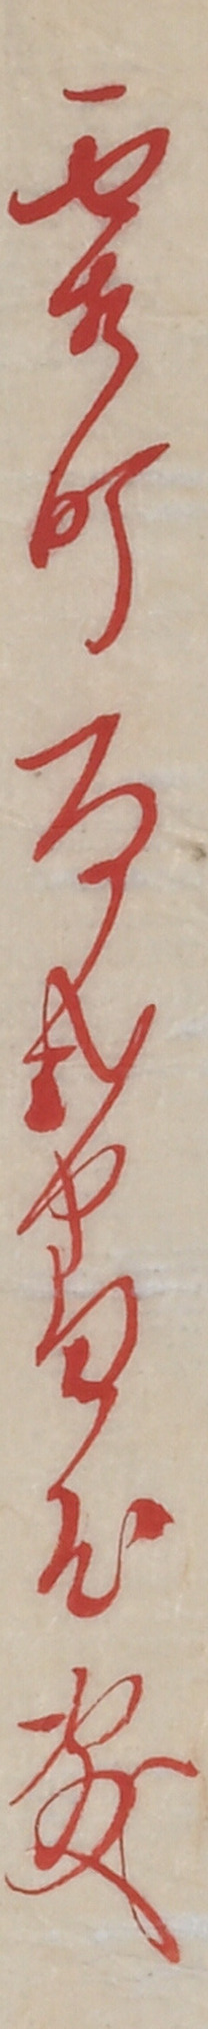霜町百弐番屋敷
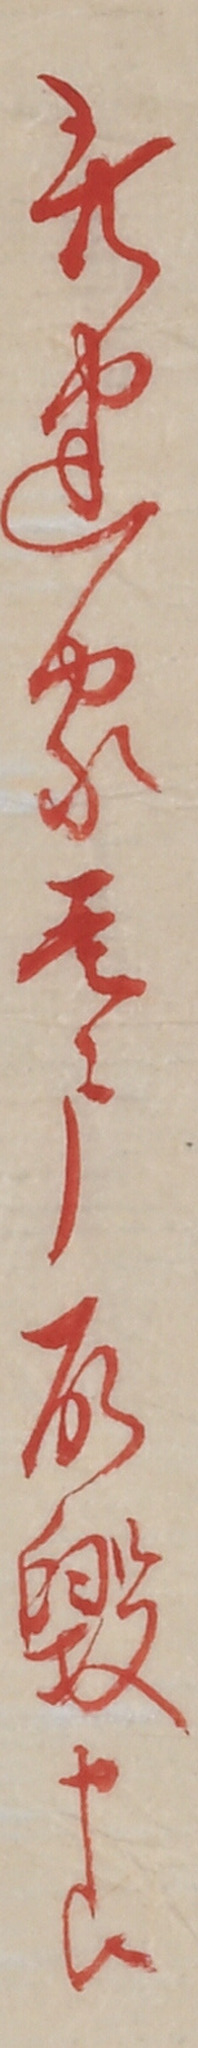此建家壱戸取毀申候

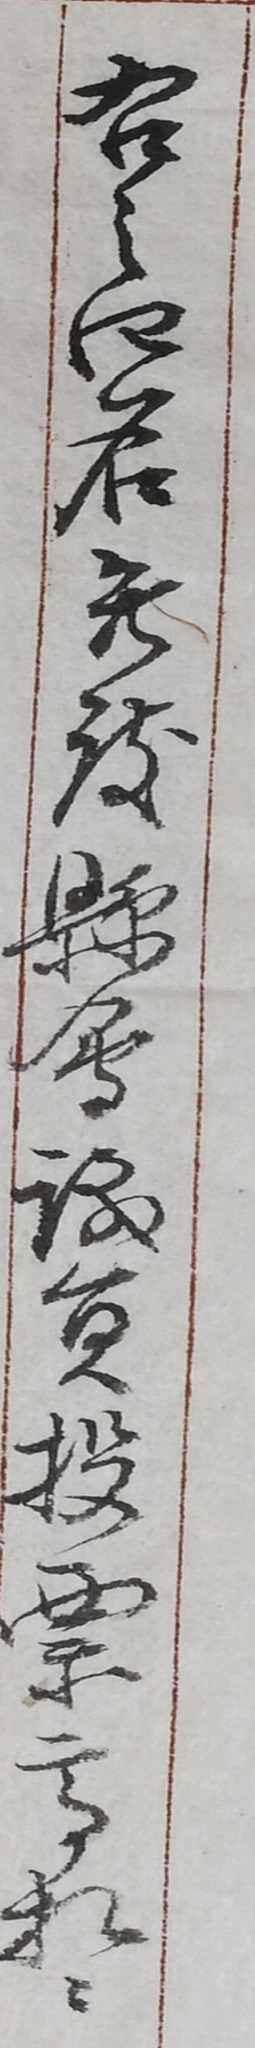右之四名此度県会議員投票高札ニ
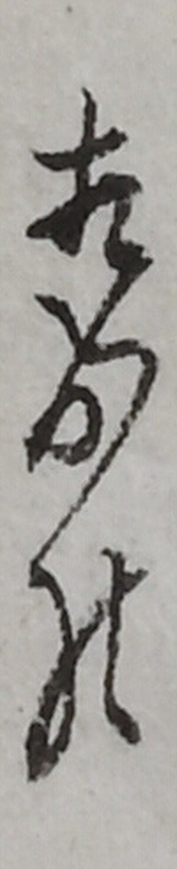相成候
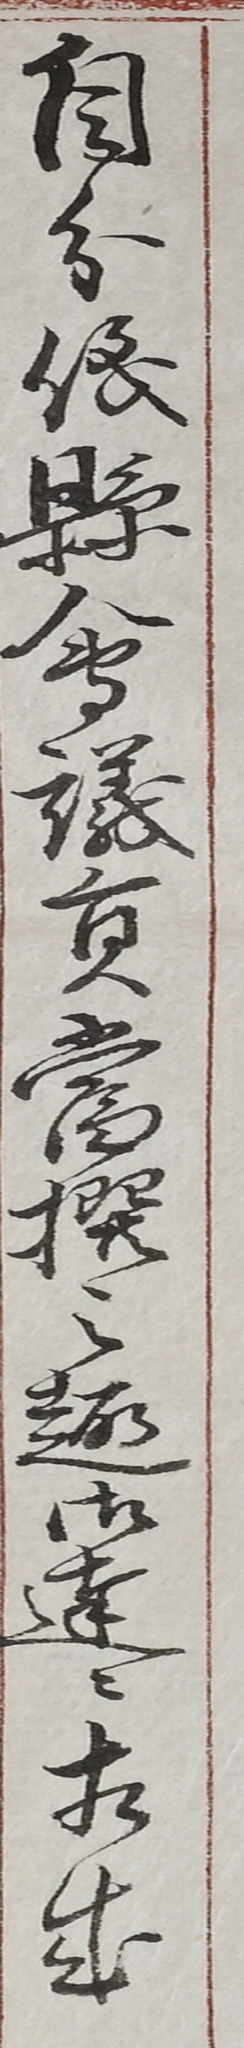自分儀縣会議員當撰之趣御達ニ相成
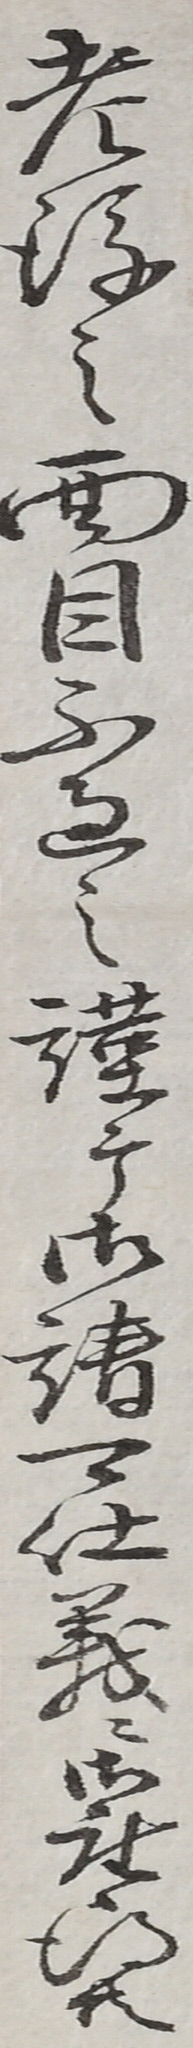老後之面目不過之謹テ御請可仕義ニ御座候得共
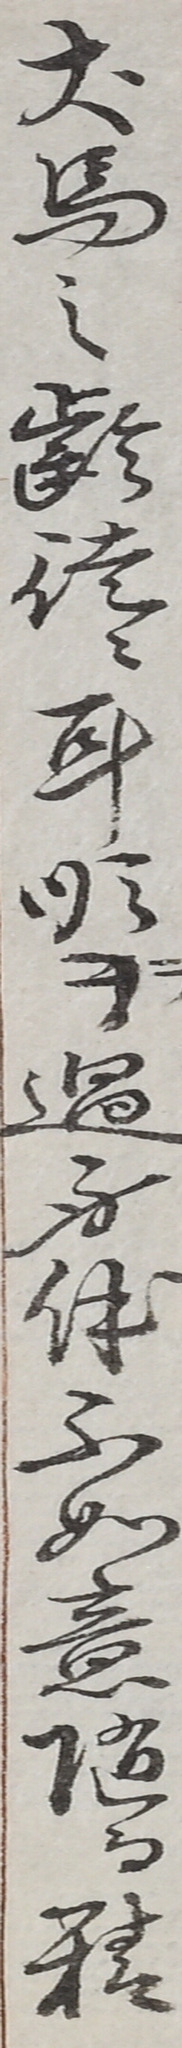犬馬之齢徒ニ耳順ヲ過身体不如意随而精
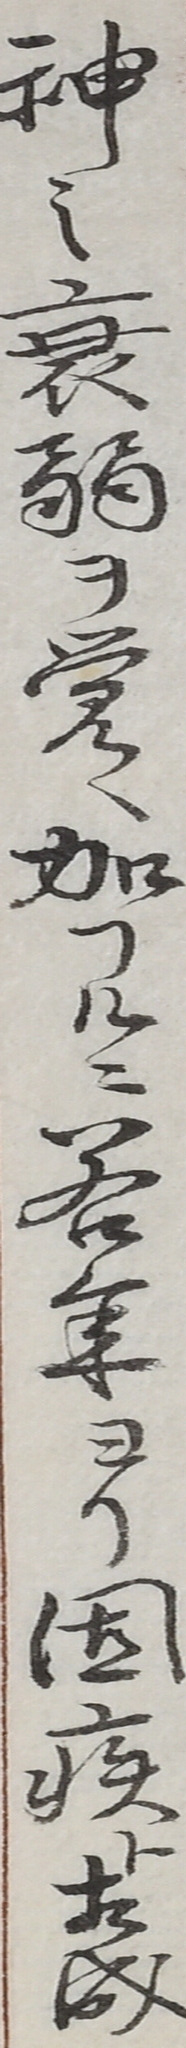神之衰弱ヲ覚へ加フルニ若年ヨリ固疾ト相成
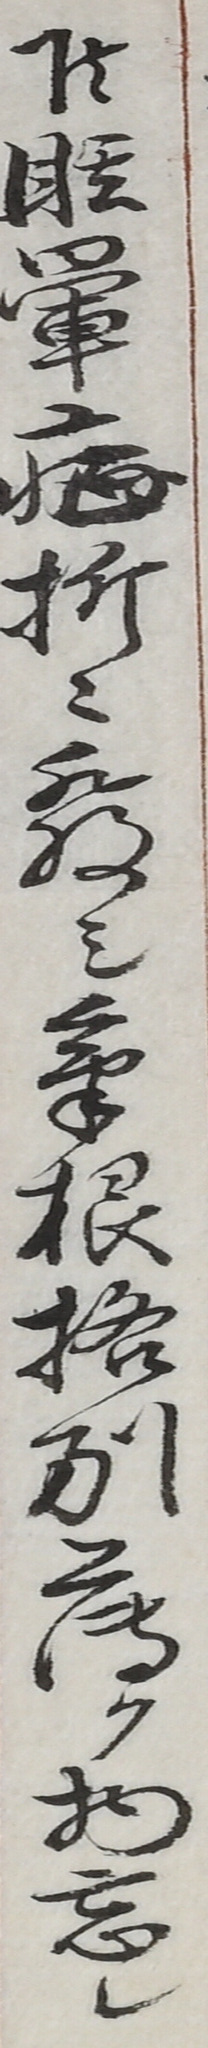候眩暈症折々発シ気根格別薄ク物忘レ
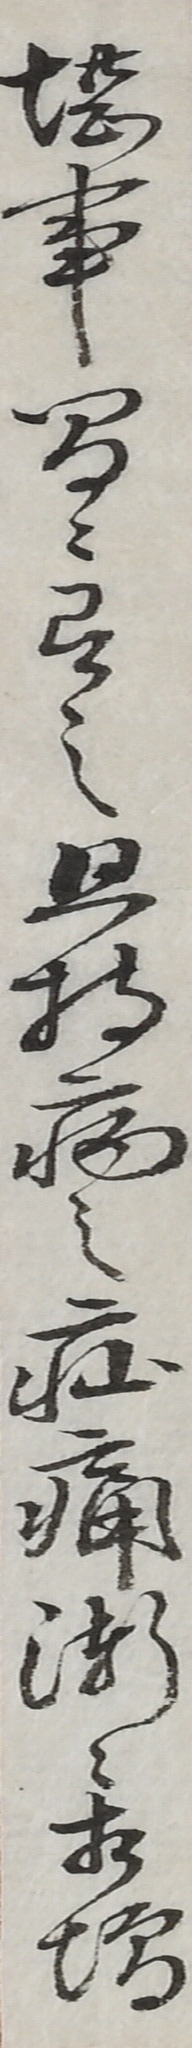堪事間々有之且持病之疝痛漸々相増
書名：郡役所勤務中御用抜書
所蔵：伊那市立高遠町図書館・合同会社AMANE
